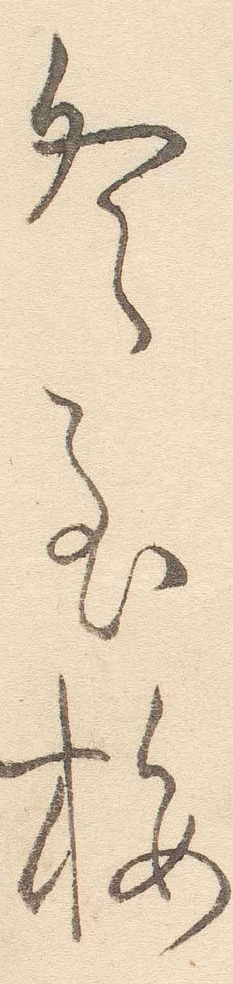冬至梅

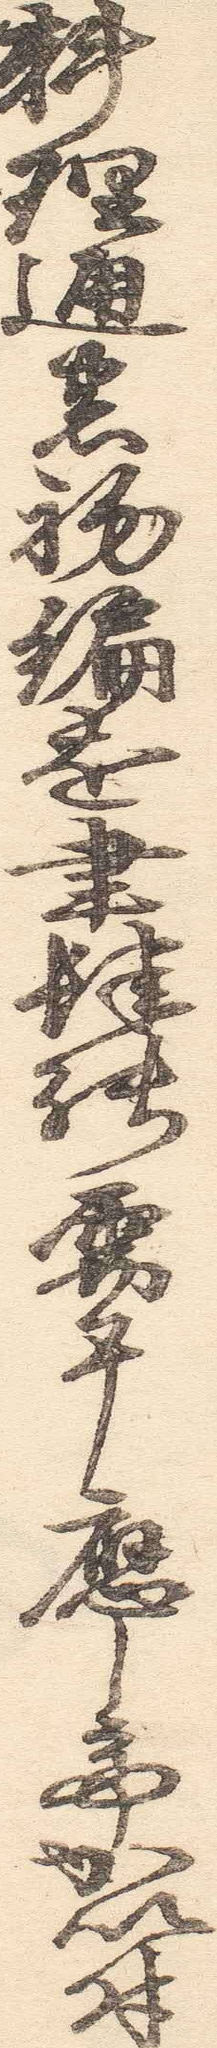料理通の初編を書肆の需に応してかい付
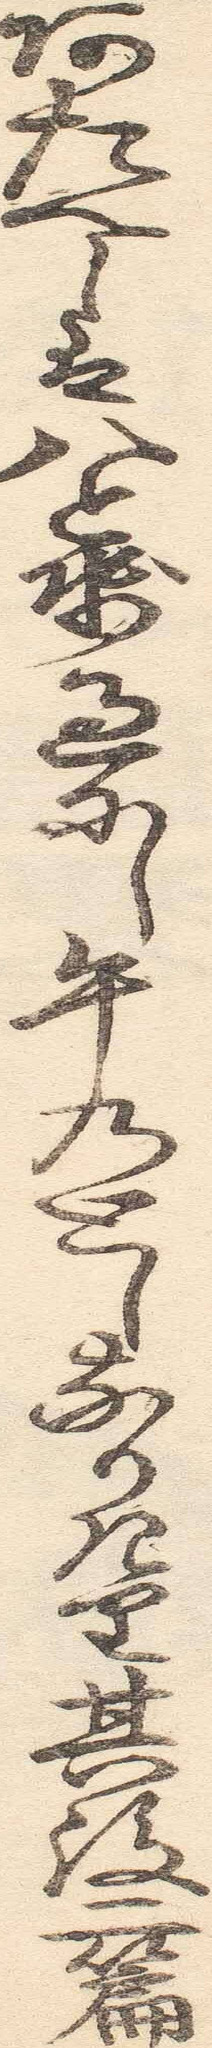あたへしは八とせ過にし午のとしなりけり其後二篇
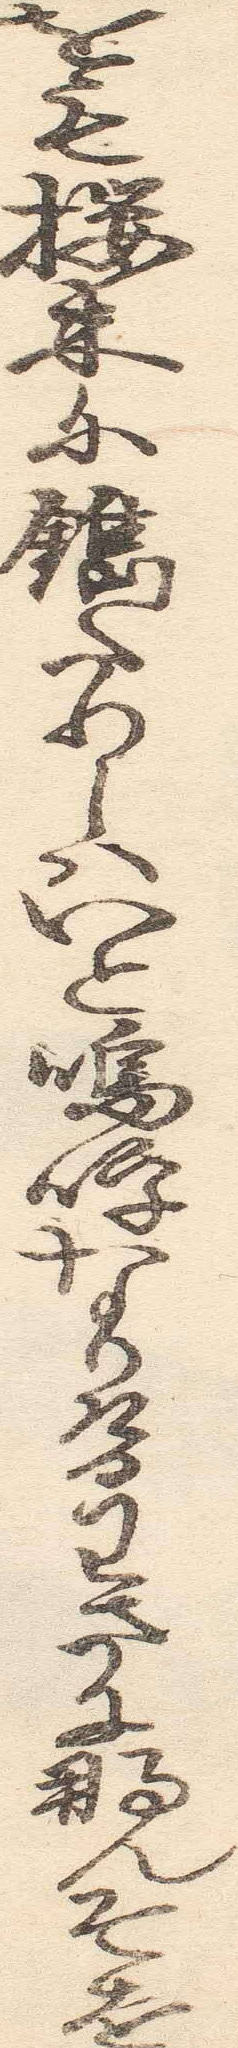をも桜木に鐫たりしはいと嗚呼なりけるわさになんそを
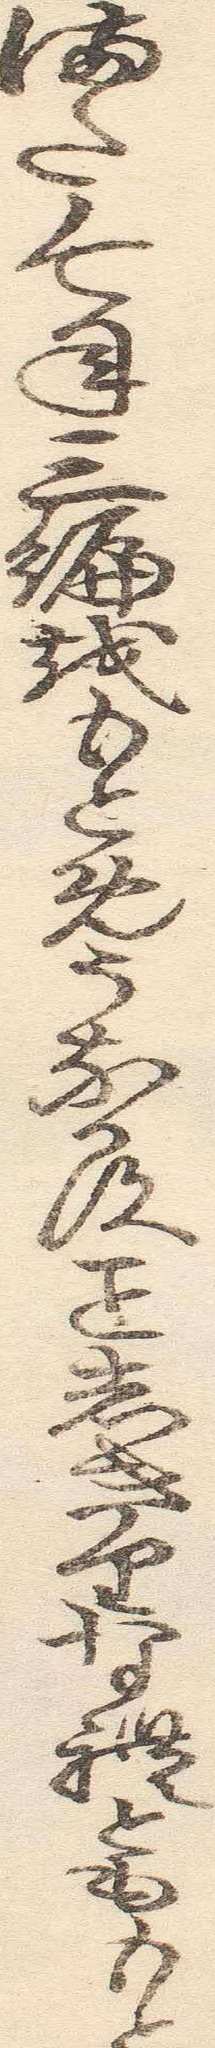また今年三編をもとめうなかすことしきりなれとももと
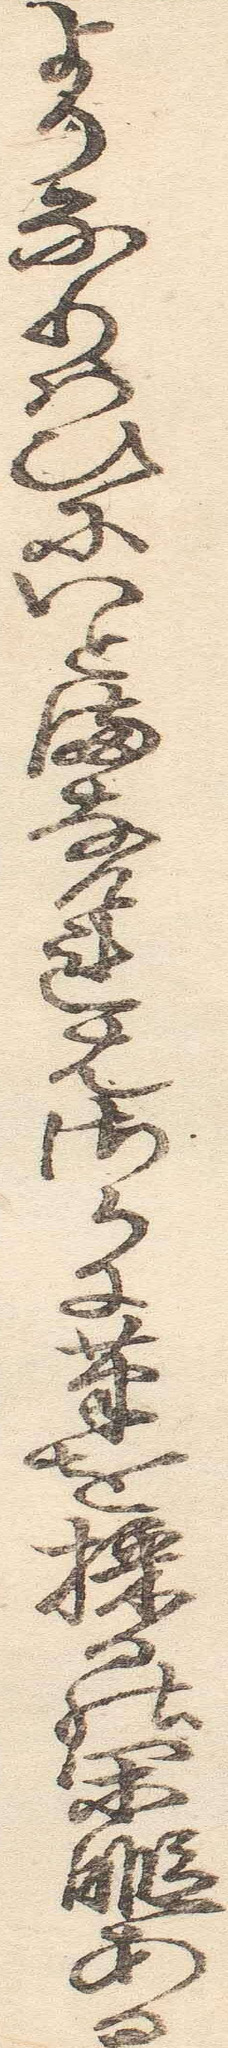よりなりはひにいとまなけれはさらに筆を採るの閑暇ある
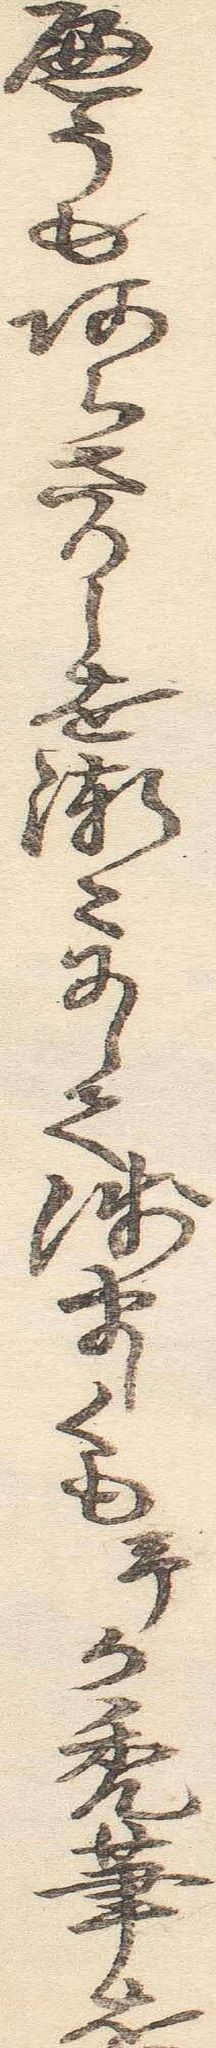へうもあらさりしを漸々にして浅ましくも予か禿筆を
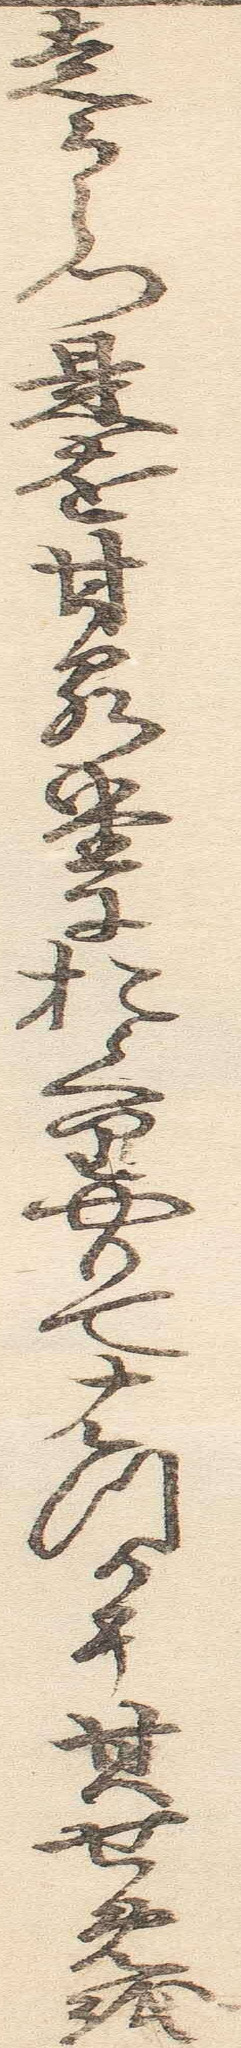走らしつ是を甘泉堂におくりやりてはつかに其せめを
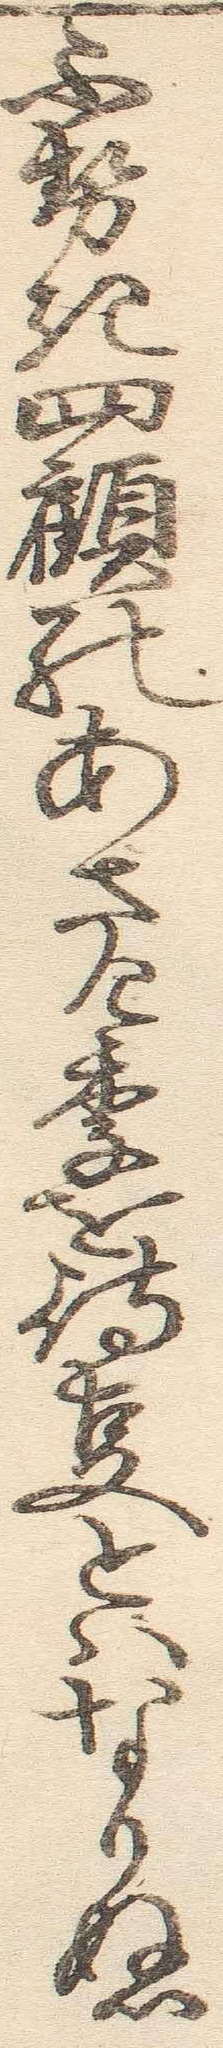ふせき四顧のあさけりを待事とはなりぬ
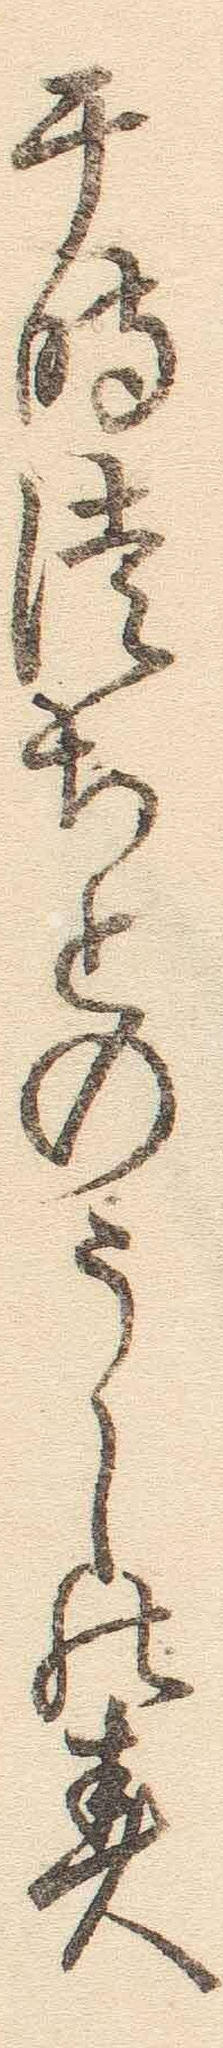于時つちのとのうしの春
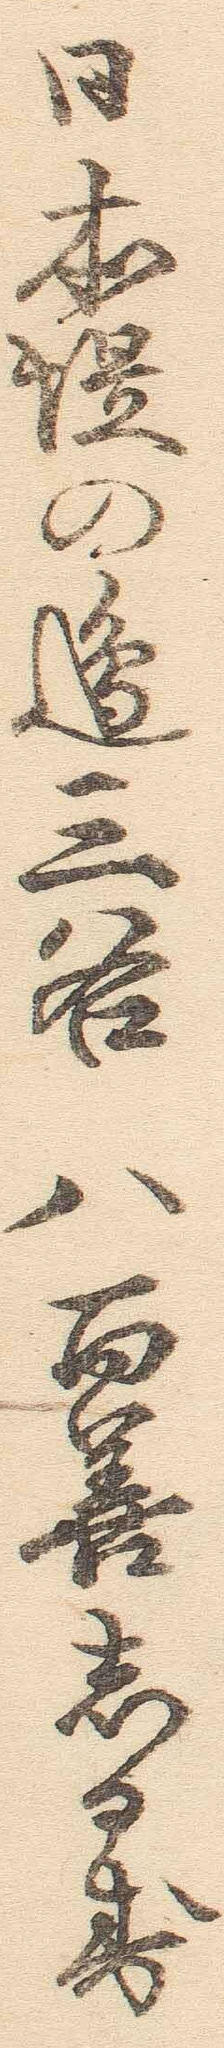日本堤の辺三谷八百善しるす

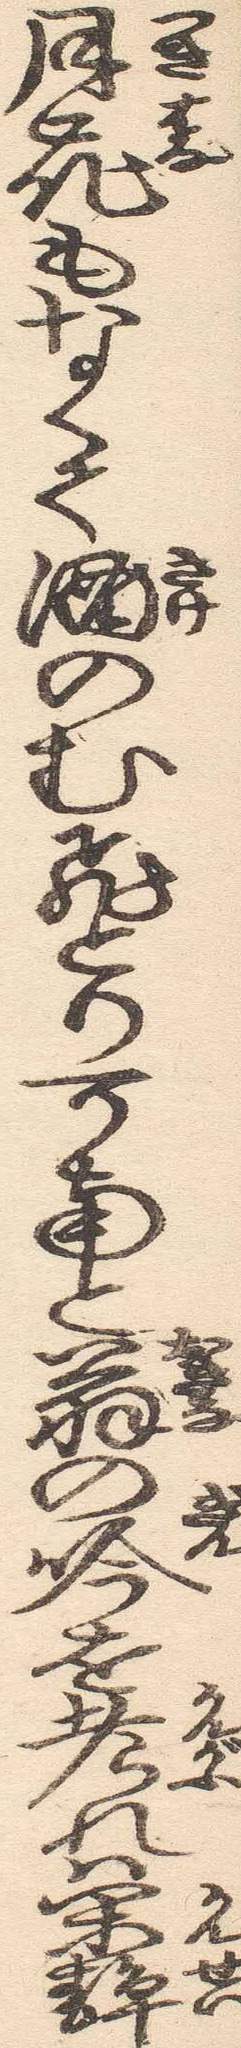月花もなくて酒のむひとりかなと翁の吟を考れは閑静
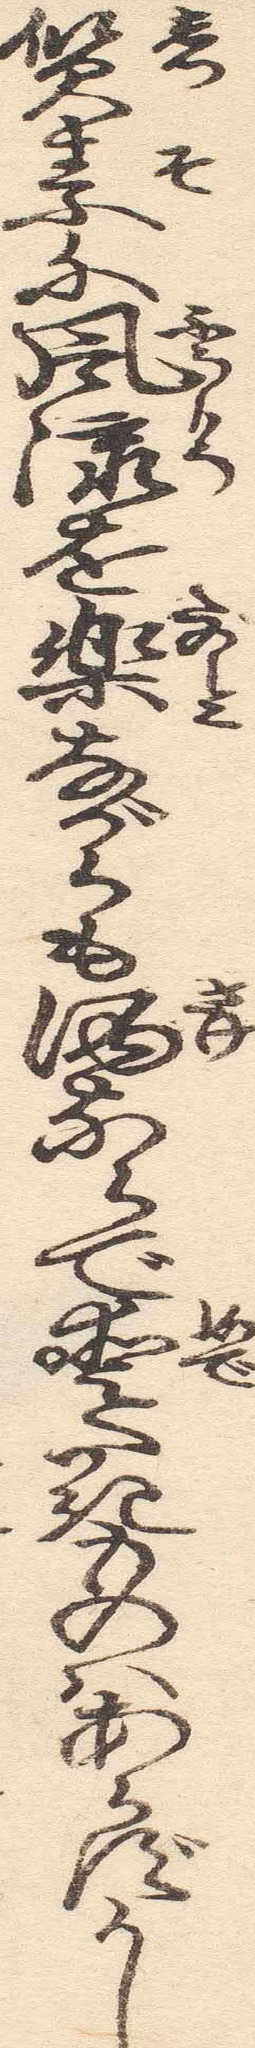質素に風流を楽ながらも酒ならで愛たきものはあらずかし
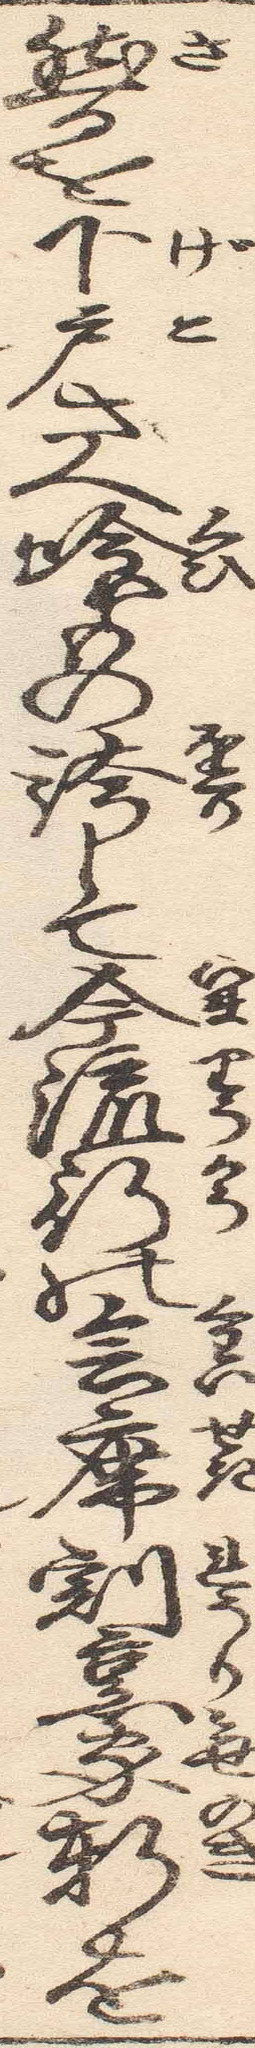然るを下戸さへ喰もの誇して今流行の会席割烹家軒を
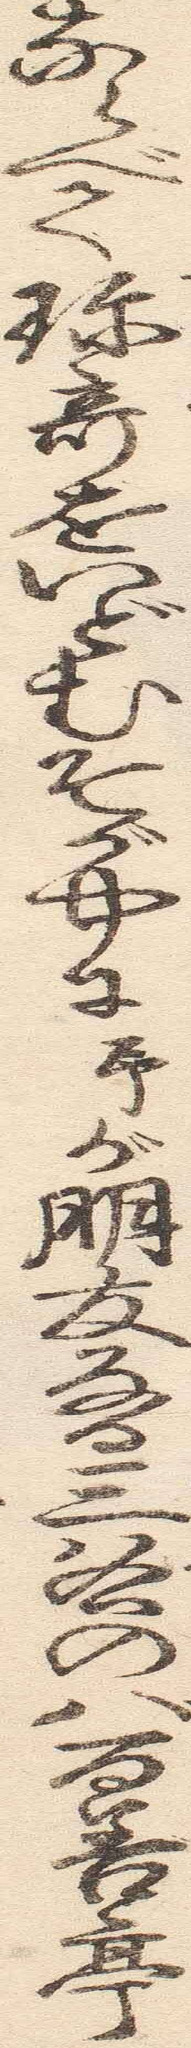ならべて珍奇をいどむそが中に予が朋友なる三谷の八百善亭
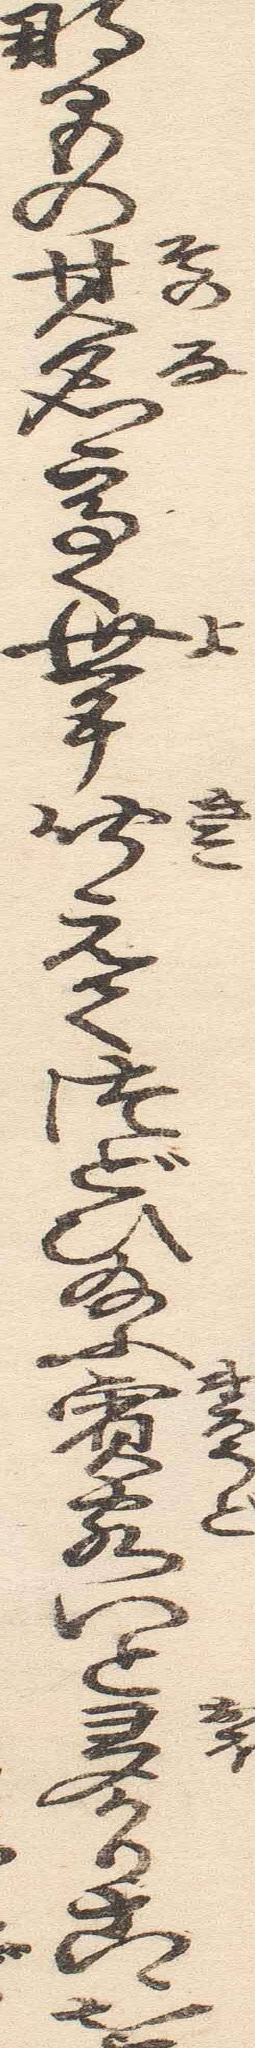なるもの其名高く世に聞えてつどひ給ふ賓客いと多かりこゝを
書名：料理通
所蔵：東京学芸大学附属図書館 国文学研究資料館
